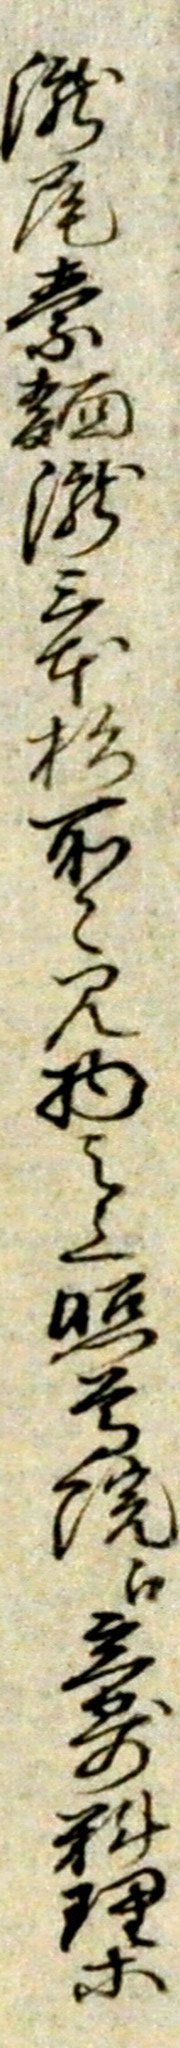瀧尾素麺瀧三本杉所々見物之上照尊院江立寄料理等
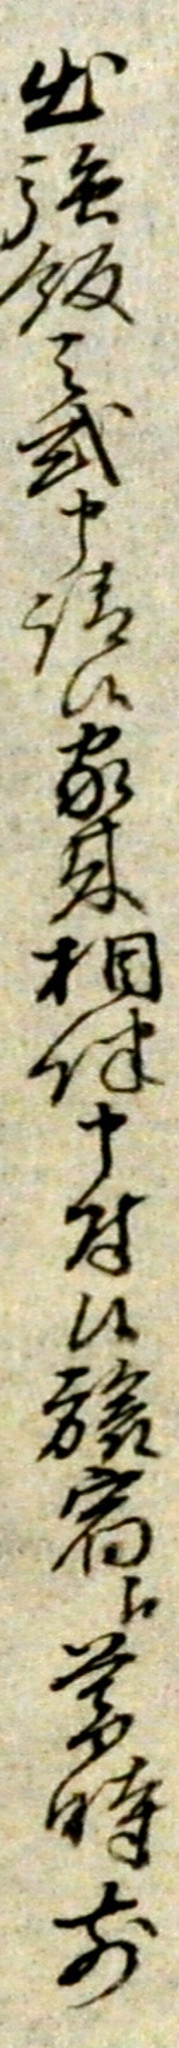出強飯之式申請候家来相伴申付候旅宿江暮時前
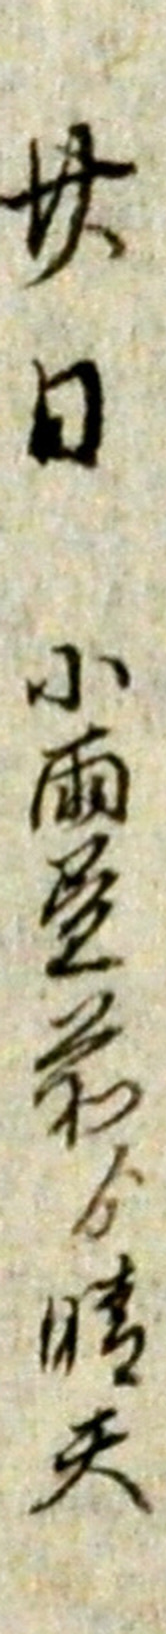廿日小雨昼前ゟ晴天
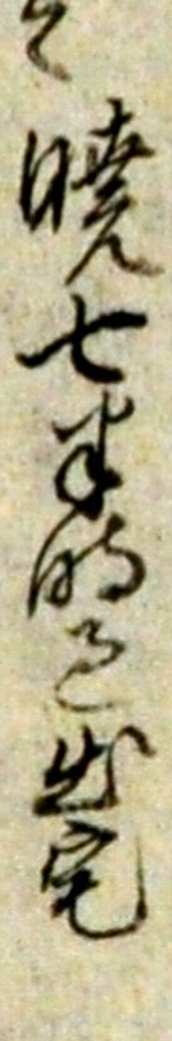之暁七半時過出宅
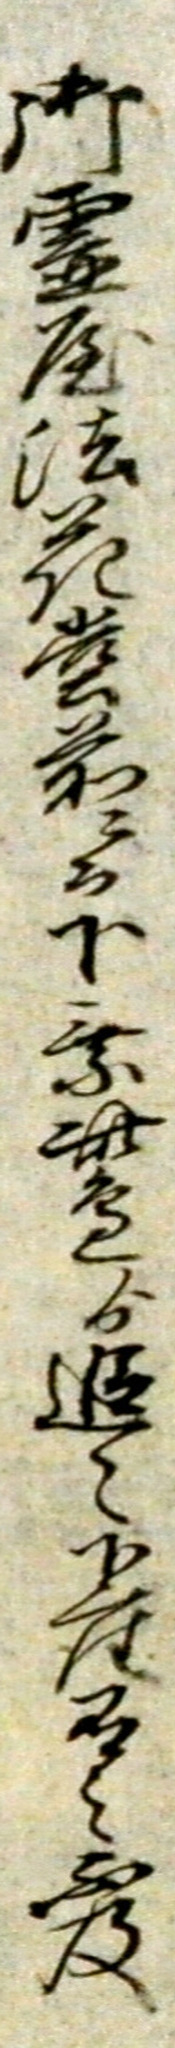霊屋法花堂前ニ而下乗此辺ゟ追々下座有之不及
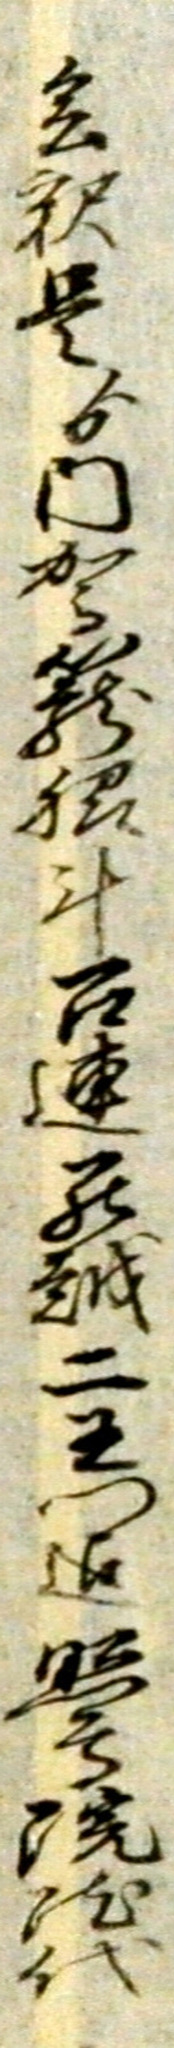会釈是ゟ内駕籠脇計召連罷越二王門迠照尊院院代
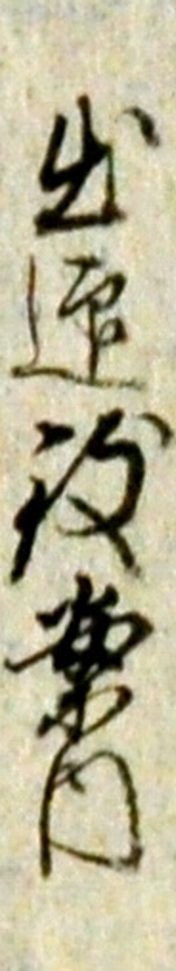出迎致案内
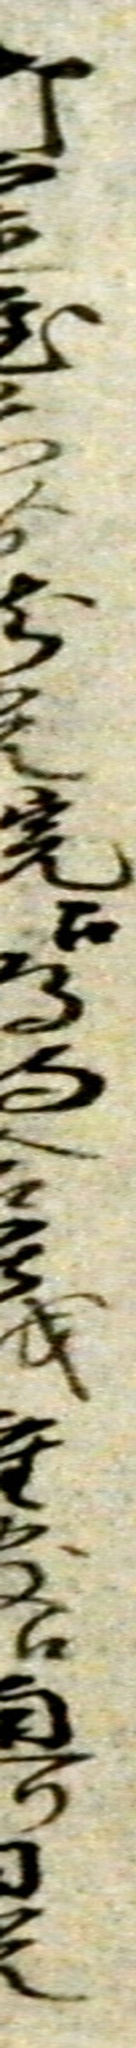御霊屋前ゟ竜光院江為待合罷越座敷江通り日光

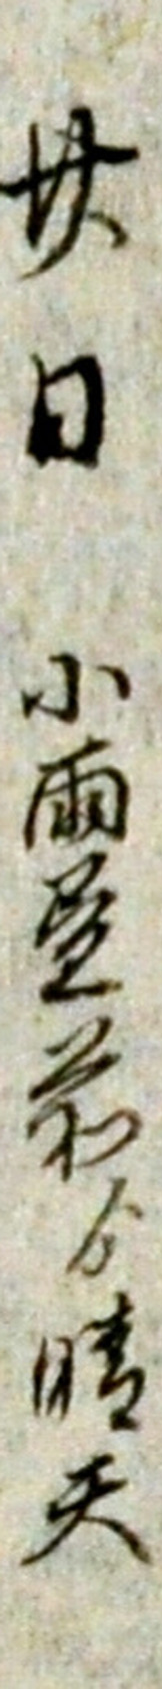廿日小雨昼前ゟ晴天
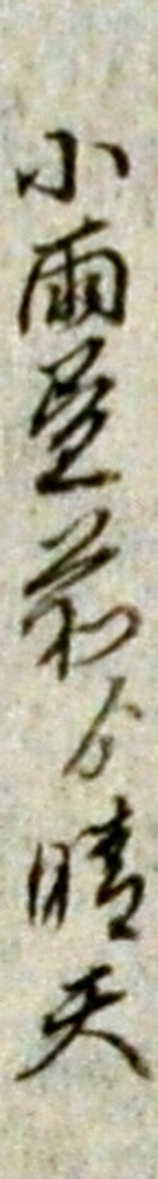廿日小雨昼前ゟ晴天
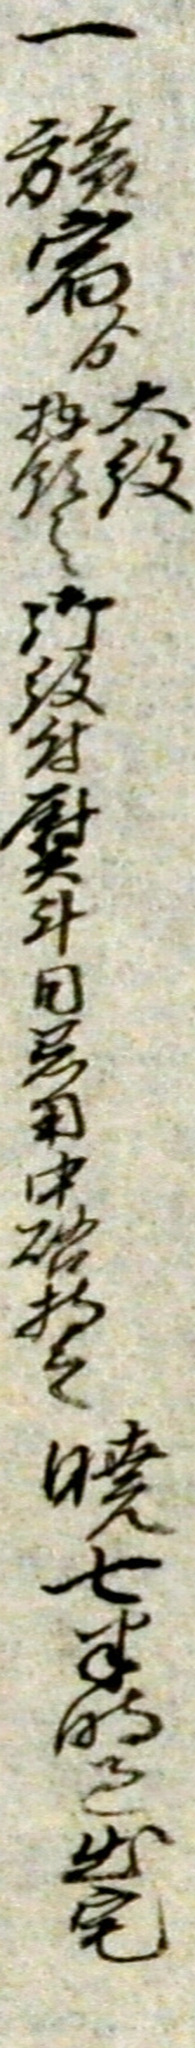一旅宿ゟ大紋拝領之御紋付熨斗目着用中啓持之暁七半時過出宅
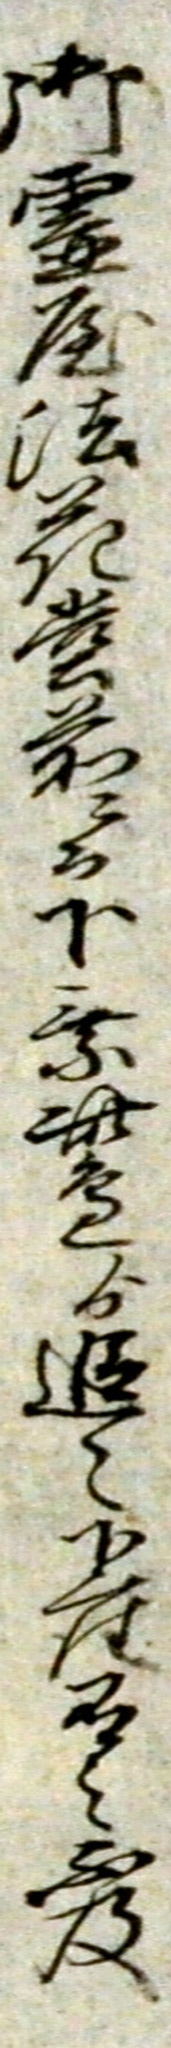御霊屋法花堂前ニ而下乗此辺ゟ追々下座有之不及
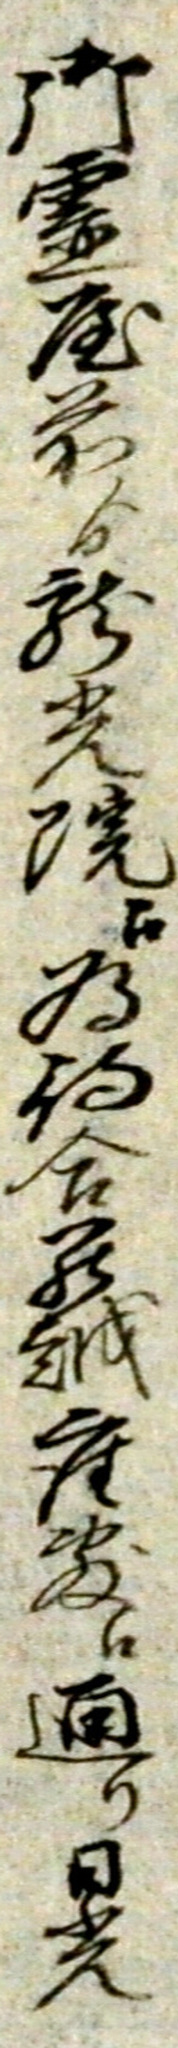御霊屋前ゟ龍光院江為待合罷越座敷江通り日光
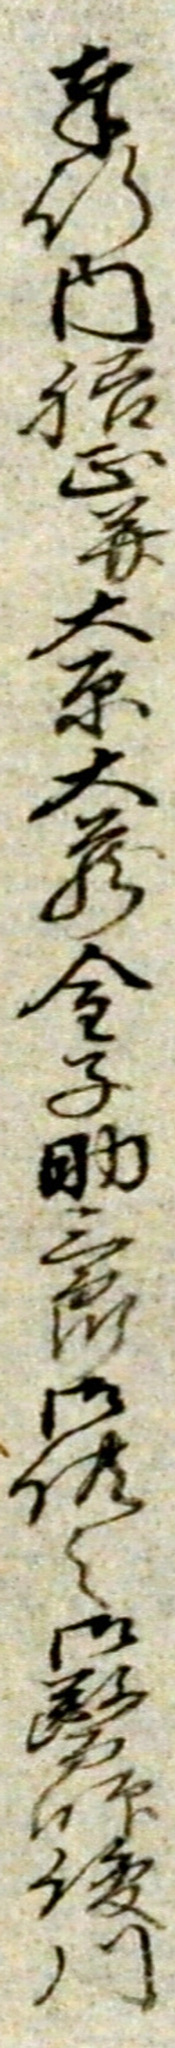奉行内膳正幷大原大蔵金子助三郎御供之御医師俊川
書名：日光御名代相勤候節ノ留
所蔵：伊那市立高遠町図書館・合同会社AMANE
